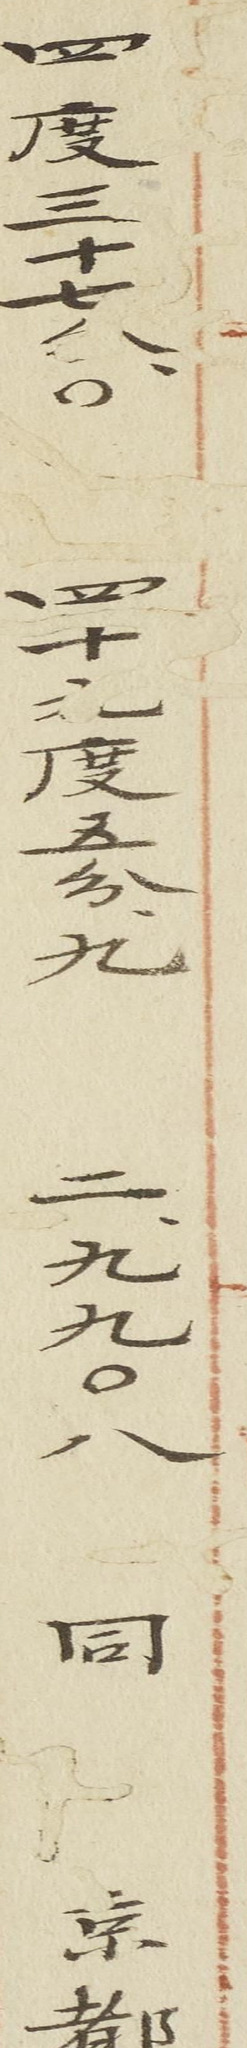四度三十七分、〇四十九度五分、九二、九九〇八同京都
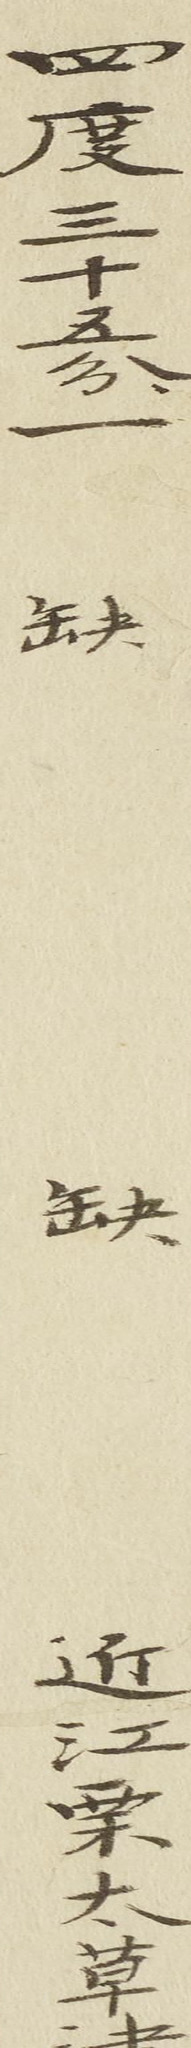四度三十五分、一欠欠近江栗太草津
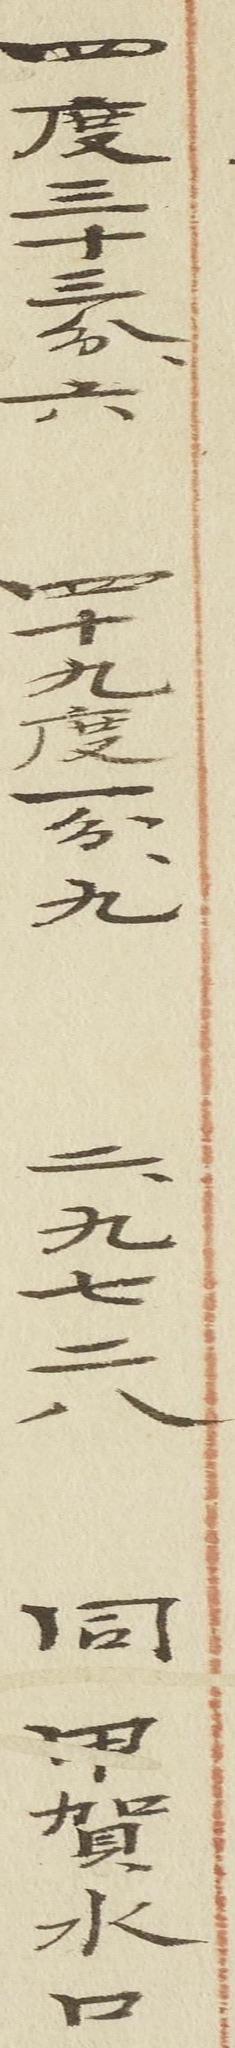四度三十三分、六四十九度一分、九二、九七二八同甲賀水口
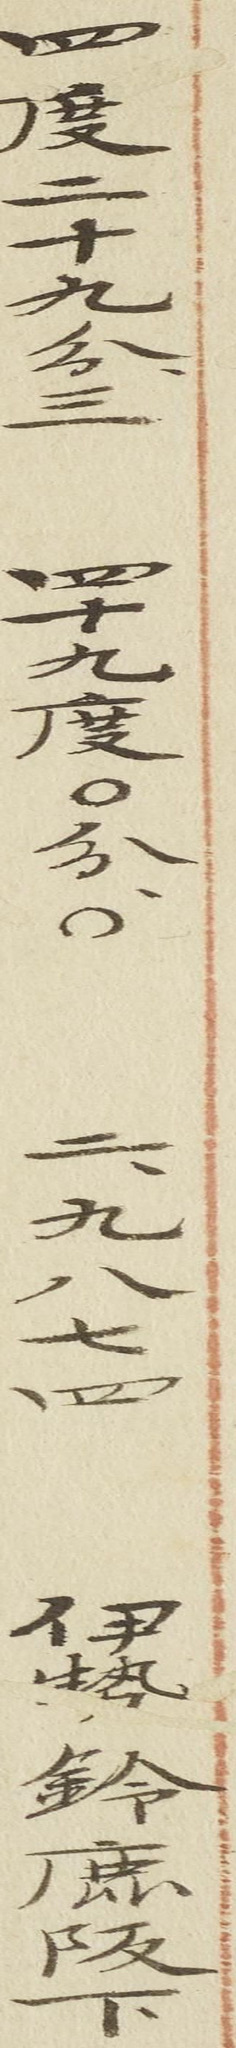四度二十九分、三四十九度〇分、〇二、九八七四伊勢鈴鹿阪下
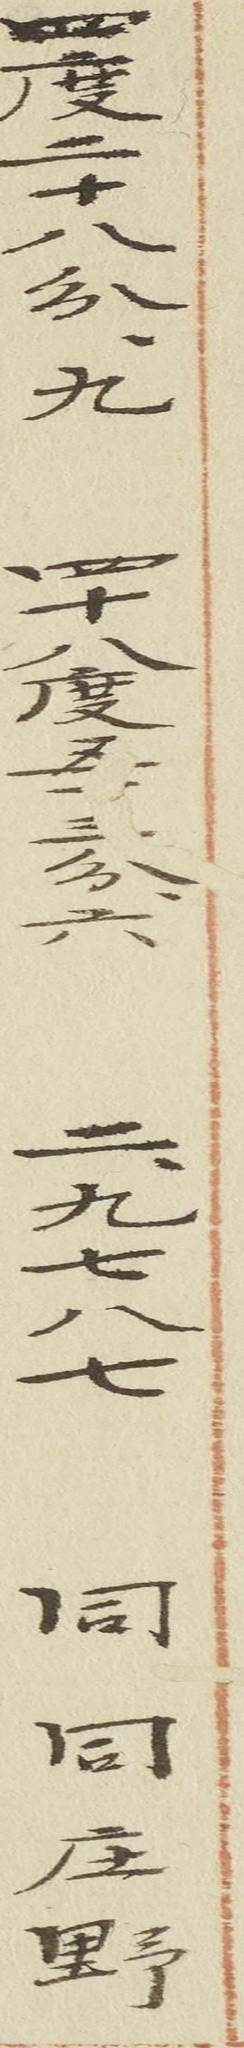四度二十八分、九四十八度五十三分、六二、九七八七同同庄野
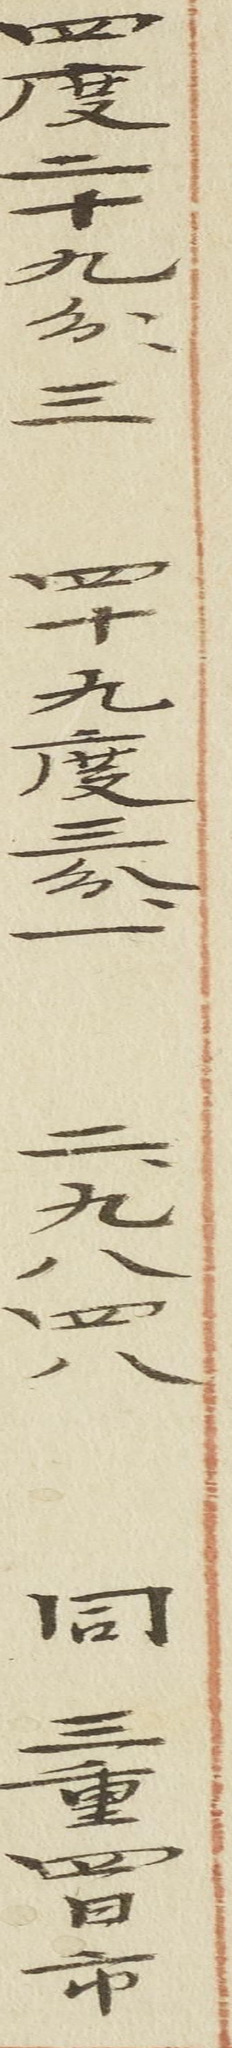四度二十九分、三四十九度三分、一二、九八四八同三重四日市
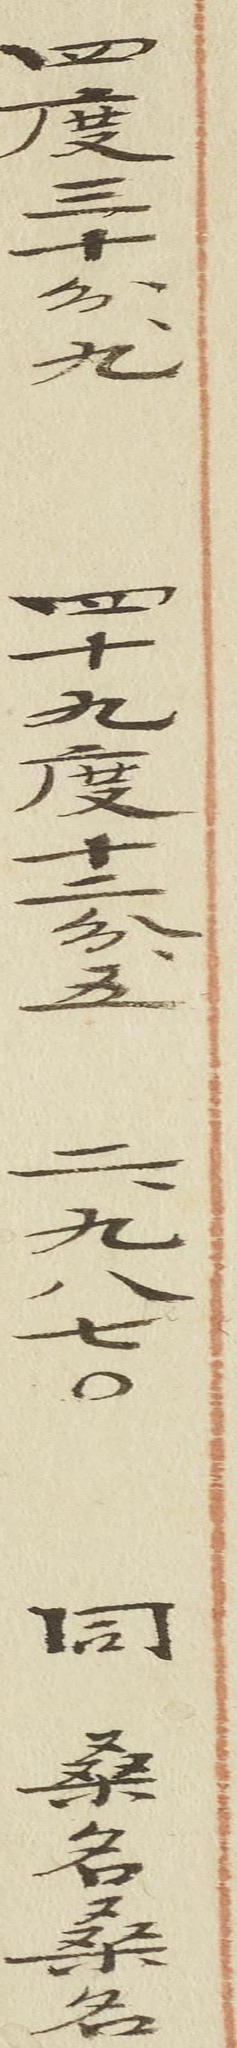四度三十分、九四十九度十二分、五二、九八七〇同桑名桑名
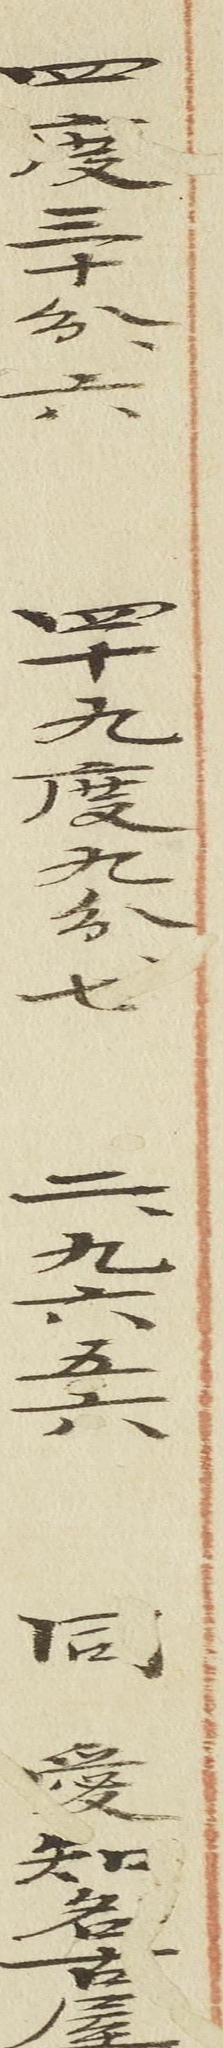四度三十分、六四十九度九分、七二、九六五六同愛知名古屋
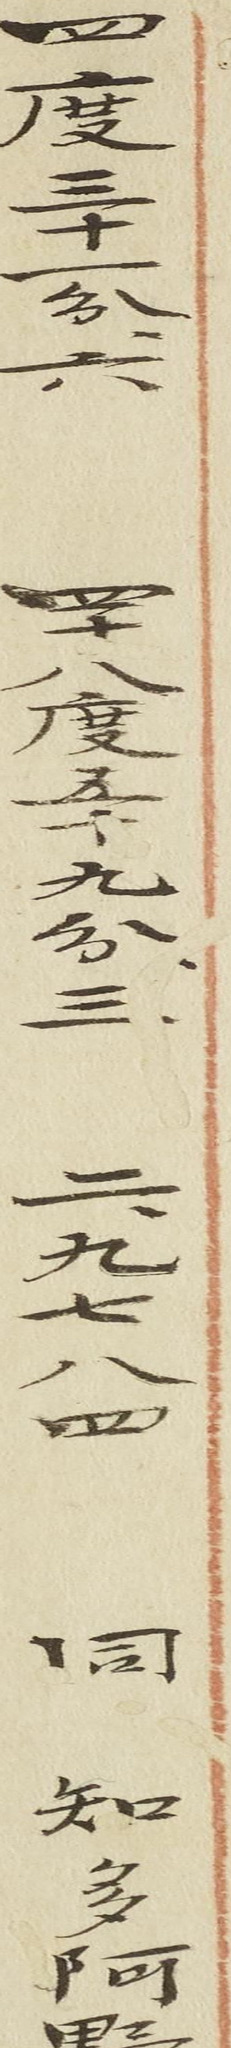四度三十一分、六四十八度五十九分、三二、九七八四同知多阿野
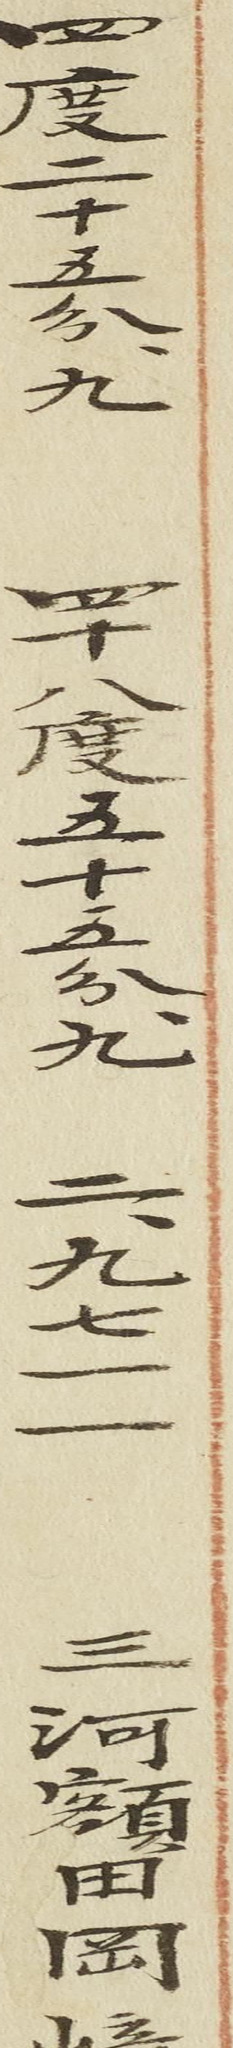四度二十五分、九四十八度五十五分、九二、九七一一三河額田岡崎
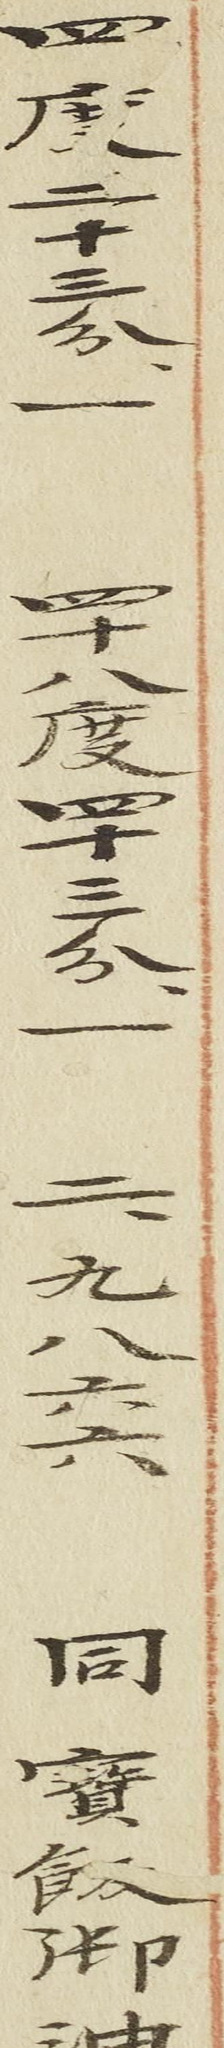四度二十三分、一四十八度四十三分、一二、九八六六同宝飯御油
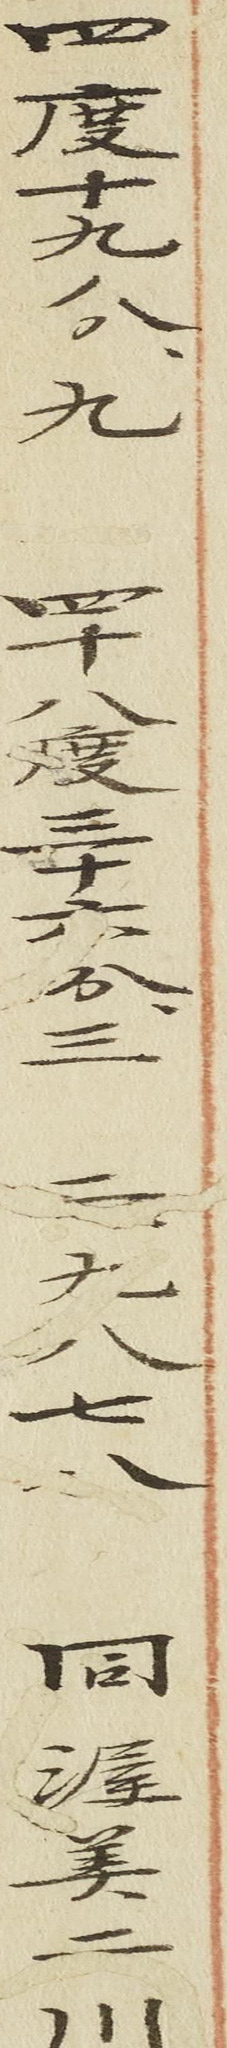四度十九分、九四十八度三十六分、三二、九八七八同渥美二川
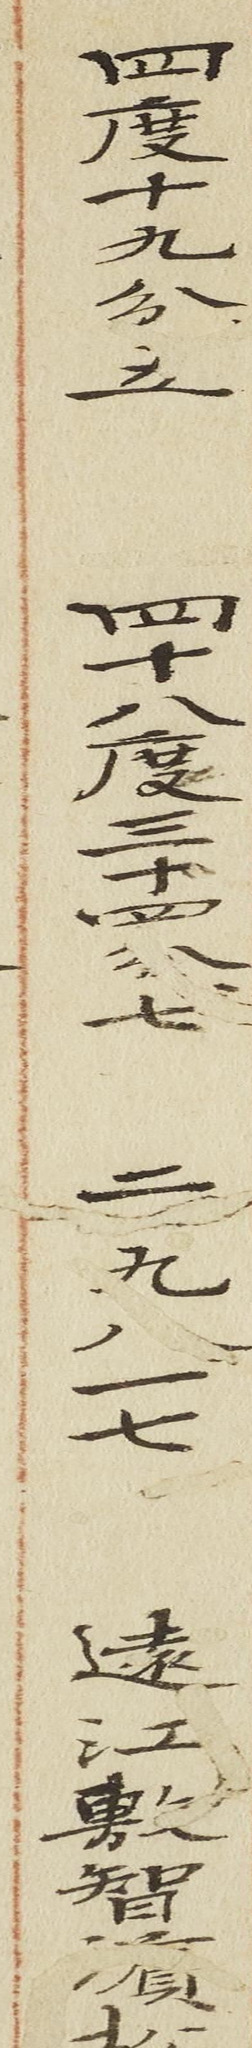四度十九分、五四十八度三十四分、七二、九八一七近江敷智浜松
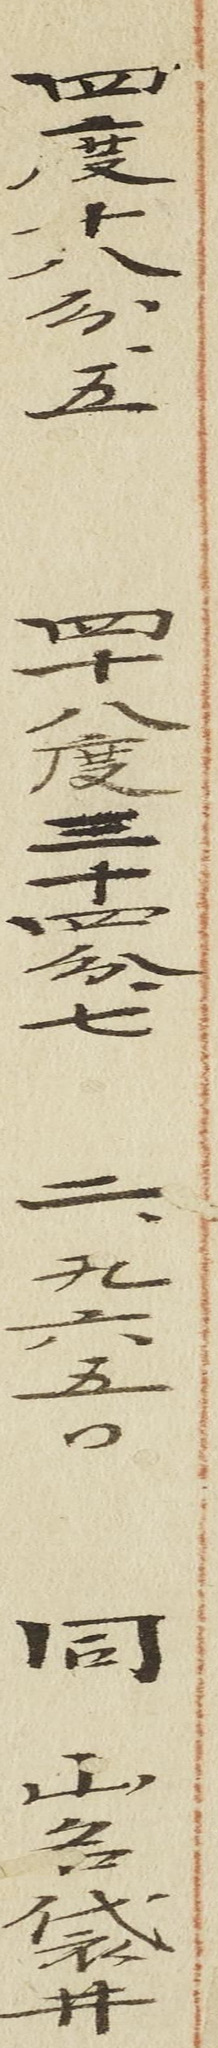四度十八分、五四十八度三十四分、七二、九六五〇同山名袋井
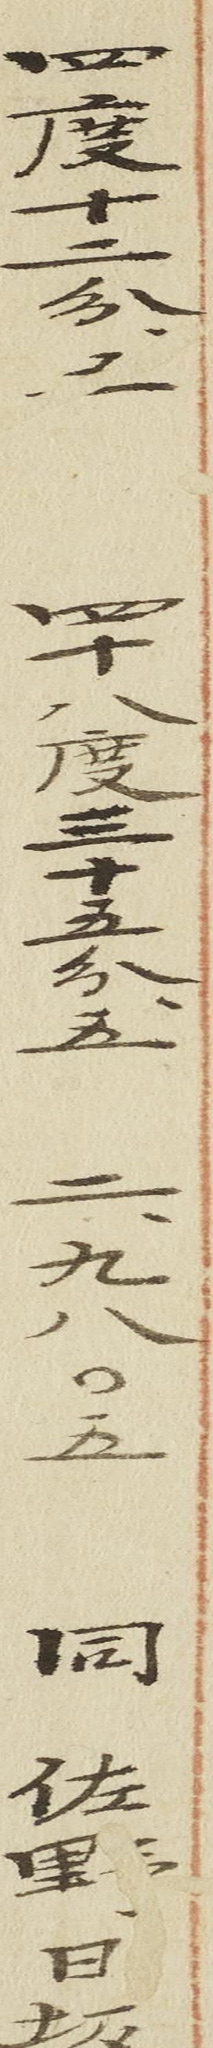四度十二分、五四十八度三十五分、五二、九八〇五同佐野日坂
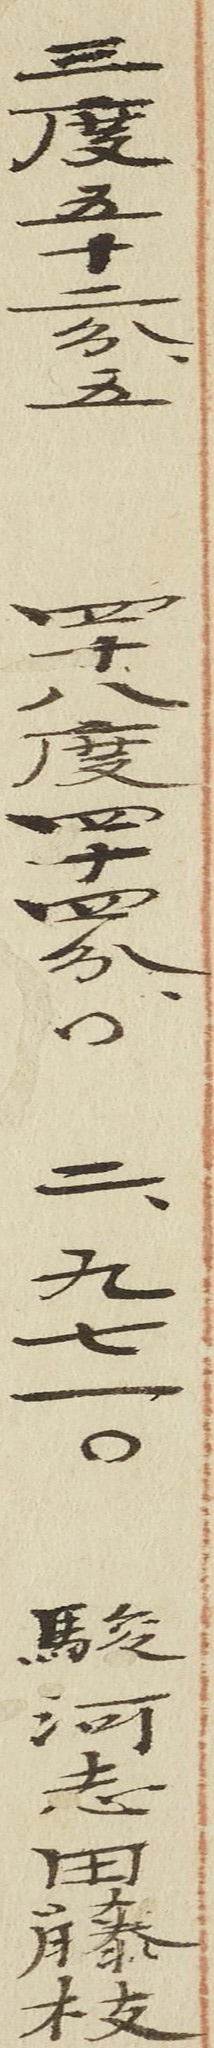三度五十二分、五四十八度四十四分、〇二、九七一〇駿河志田藤枝
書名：鑷力観測報告
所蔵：東京大学地震研究所図書室 Earthquake Research Institute Library, The University of Tokyo, JAPAN
